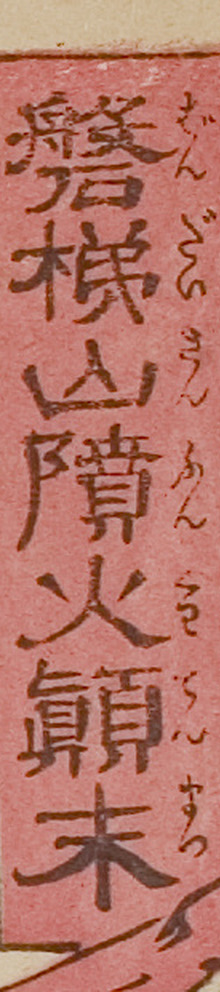磐梯山噴火顛末
